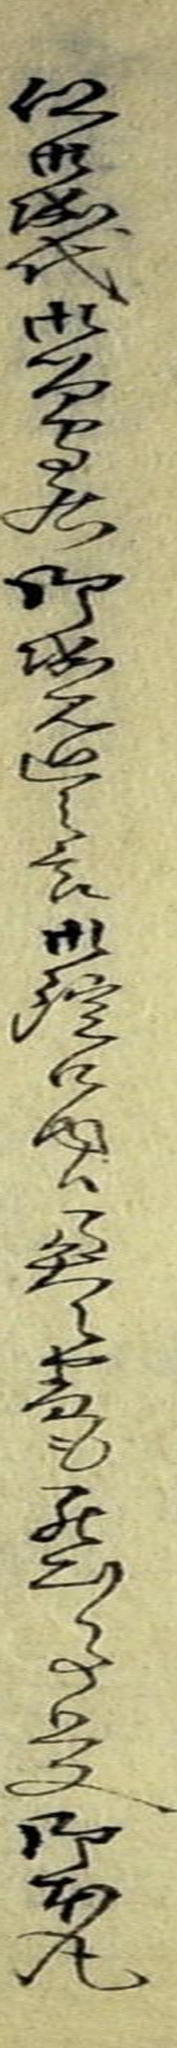但御城代御留守居御城見廻之節御錠口内ハ奥之番も罷出事且又御本丸
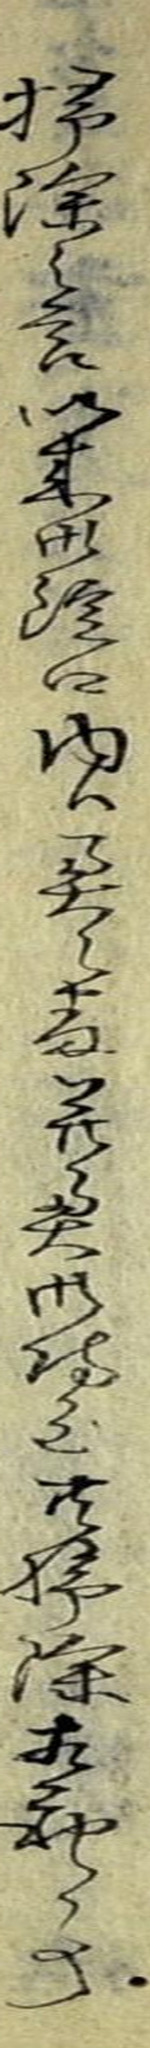掃除之節以来御錠口内ハ奥之番并奥御坊主共掃除相勤候事
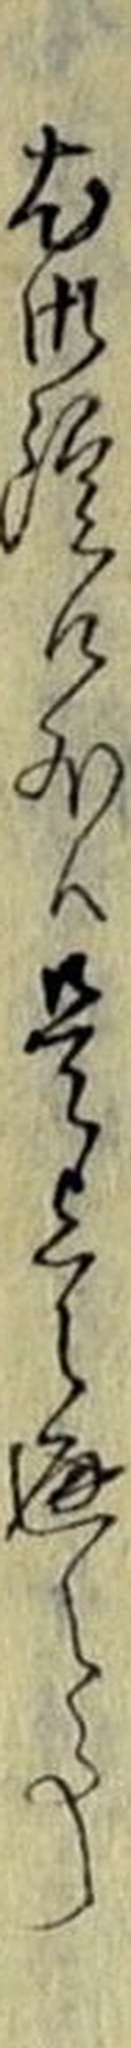尤御錠口外ハ是迄之通之事
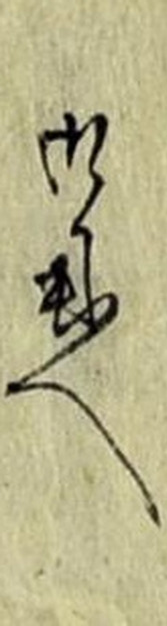御用人
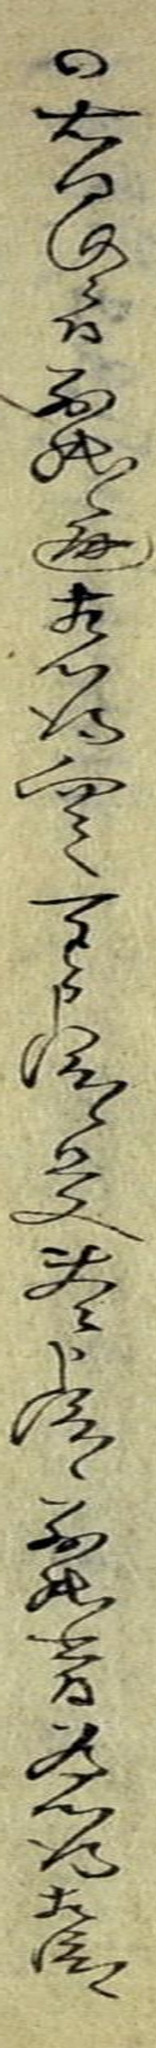○右同趣ニ付別紙之通相心得向々へ可被申渡候且又夫々申渡候別紙書付為心得相渡候
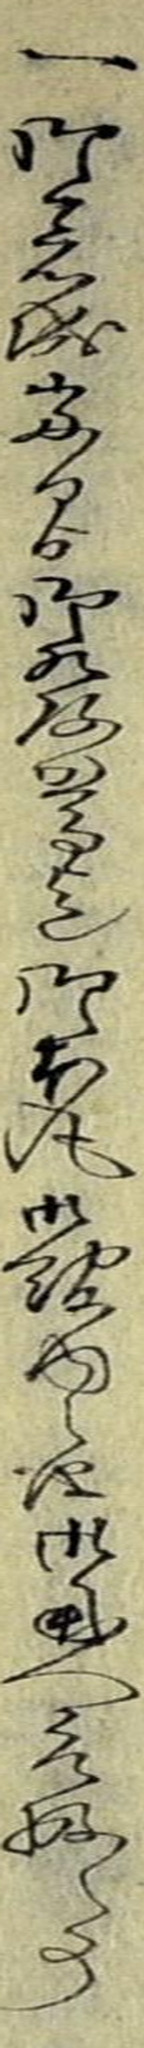一御着城当日ゟ御発駕迄御本丸御館内之儀御用人取扱之事
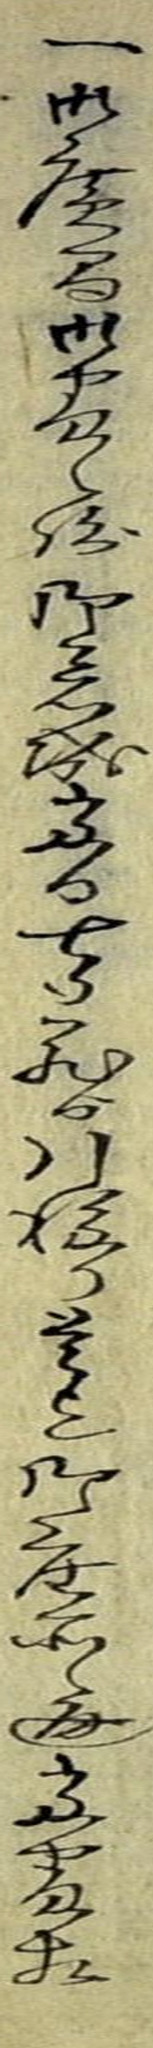一御広間御番之儀御着城当日七ツ前ゟ引移り是迄御座所之通当番相
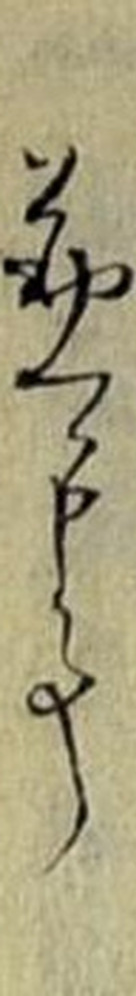勤可申事
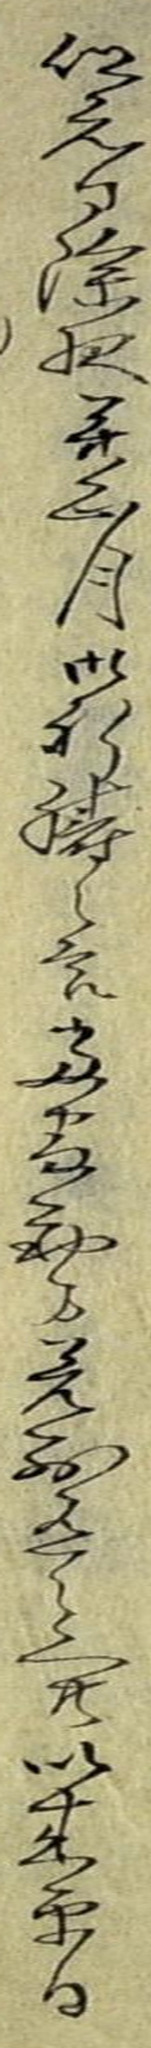但元日除夜并正月御祈祷之節当番勤方差別有之候へ共以来平日
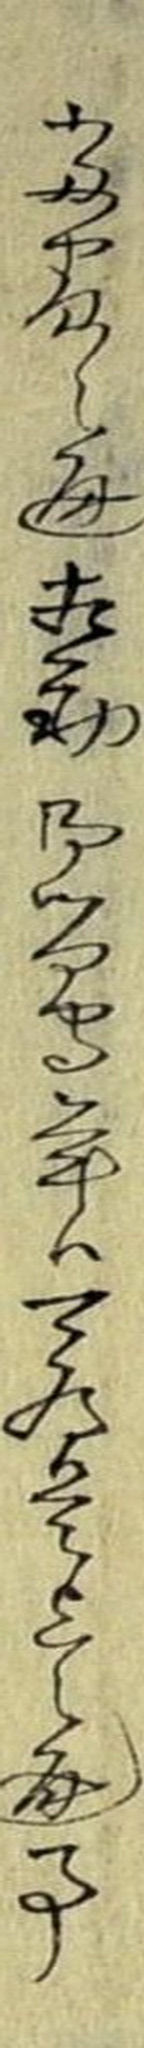当番之通相勤御留守年ハ可為是迄之通事
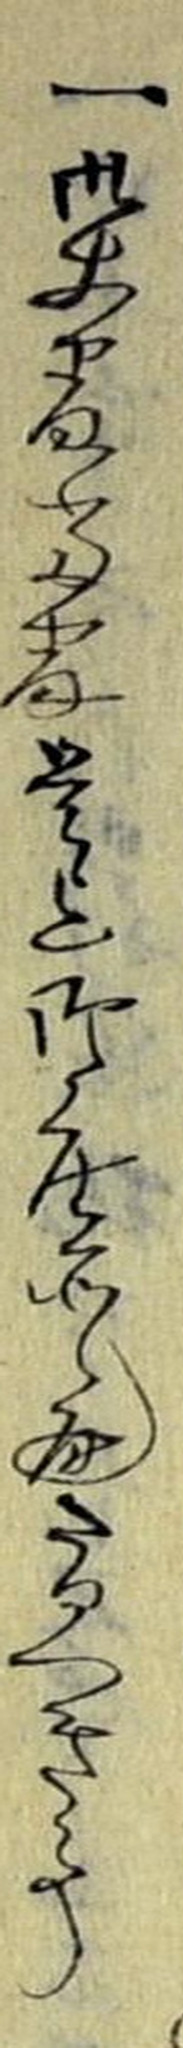一御使番当番是迄御座所之通たるへき事
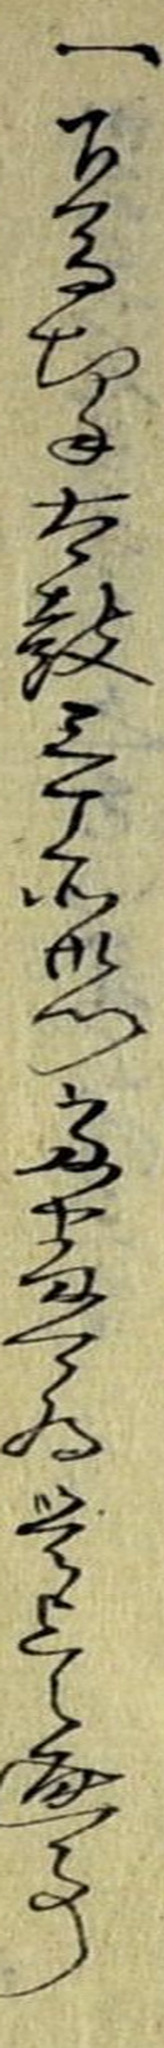一下馬切手太鼓三ケ所御門当番可為是迄之通事
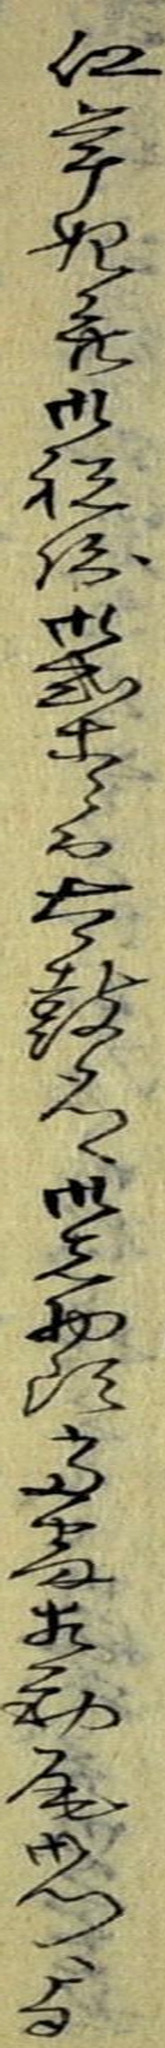但年始并御祝儀御式等ニ而太鼓御門へ御先物頭当番相勤瓦御門へ与
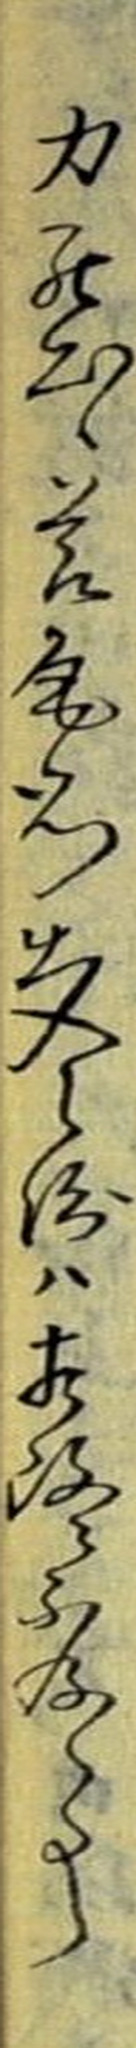力罷出候節瓦御門出入之儀ハ相改ニ不及候事
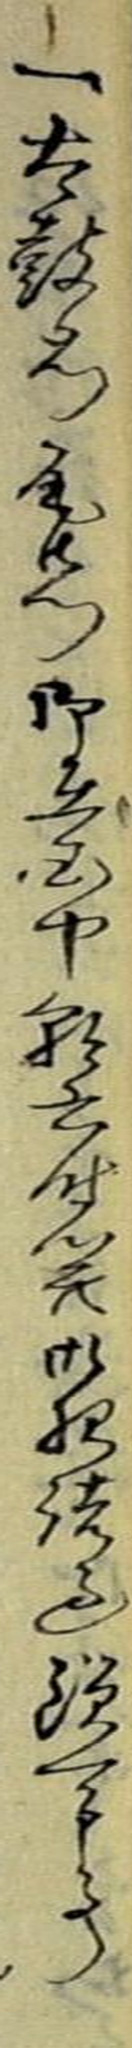一太鼓御門瓦御門御在国中朝六時開御夜詰過鎖可申事
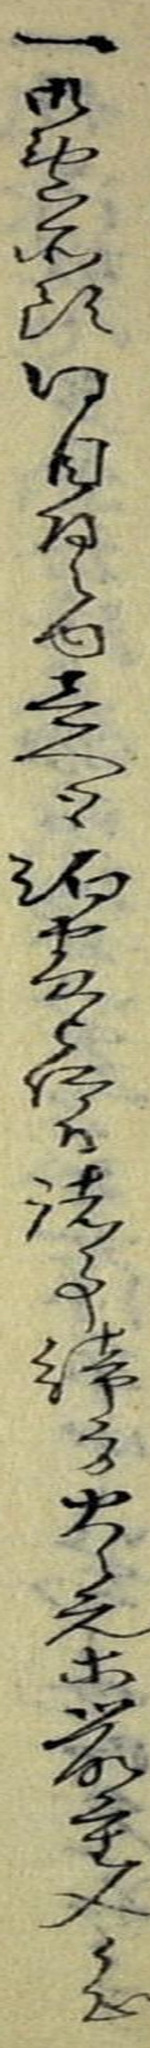一御台所頭同目付之内壱人ツヽ泊番被仰付諸事締方火之元等厳重入念
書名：命令之部 五
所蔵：福井県文書館 Fukui Prefectural Archives
